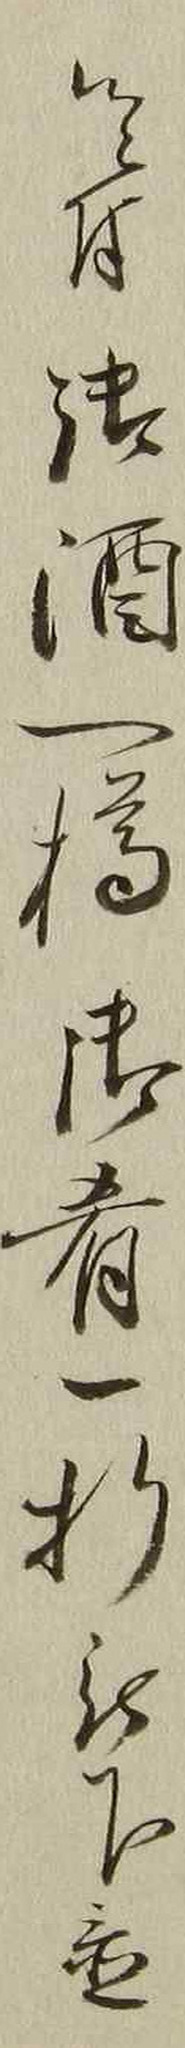候に付御酒一樽御肴一折被下置
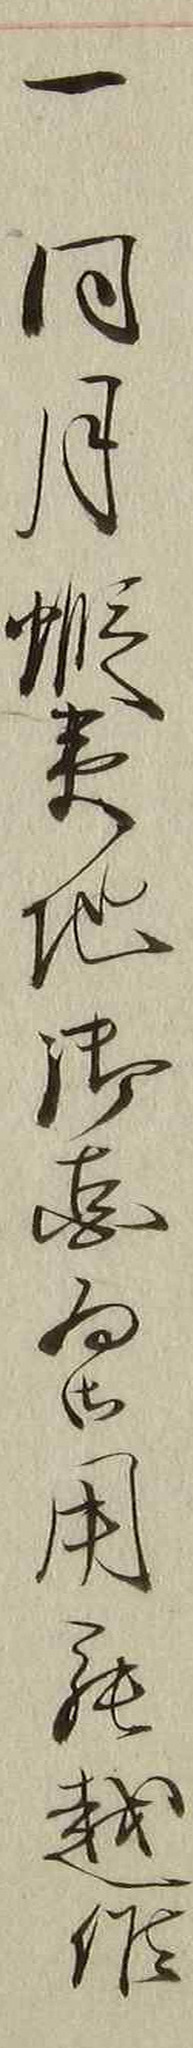一同月蝦夷地御固為御用被罷越候
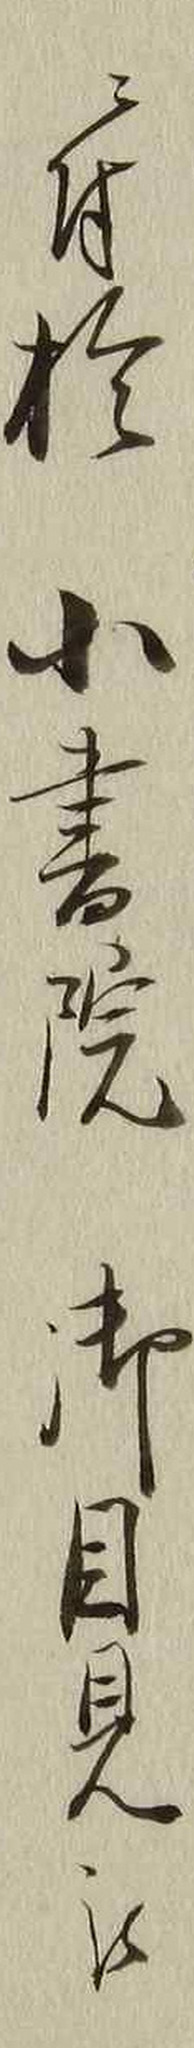に付於小書院御目見被
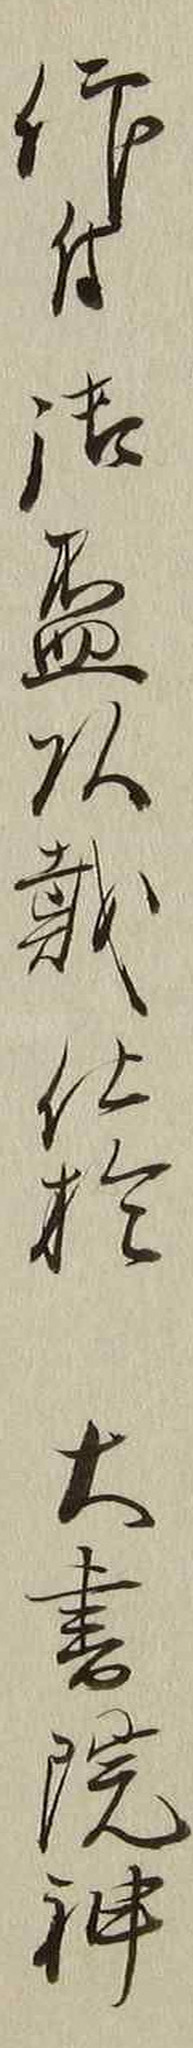仰付御盃頂戴仕於大書院神
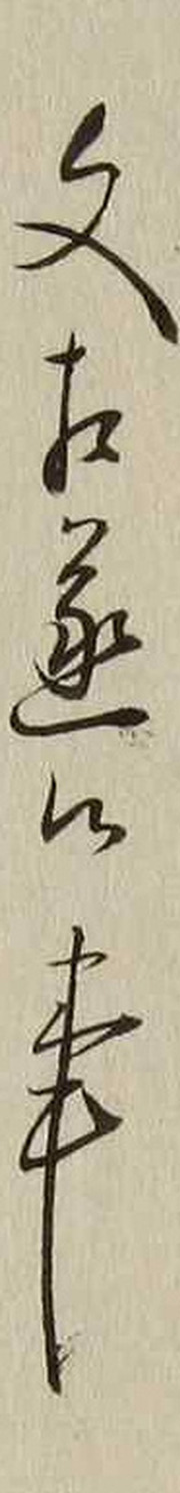文相遂候事
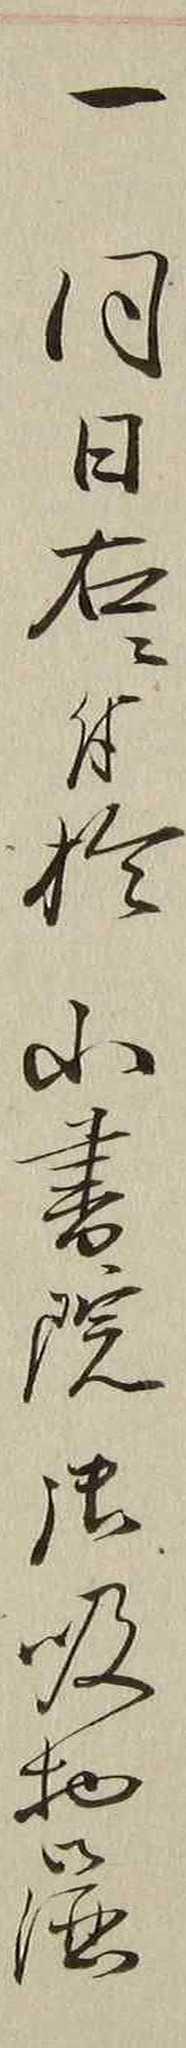一同日右に付於小書院御吸物御酒
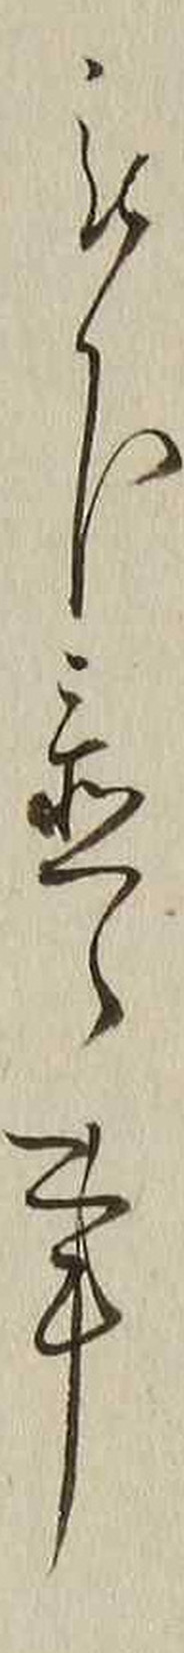被下置候事
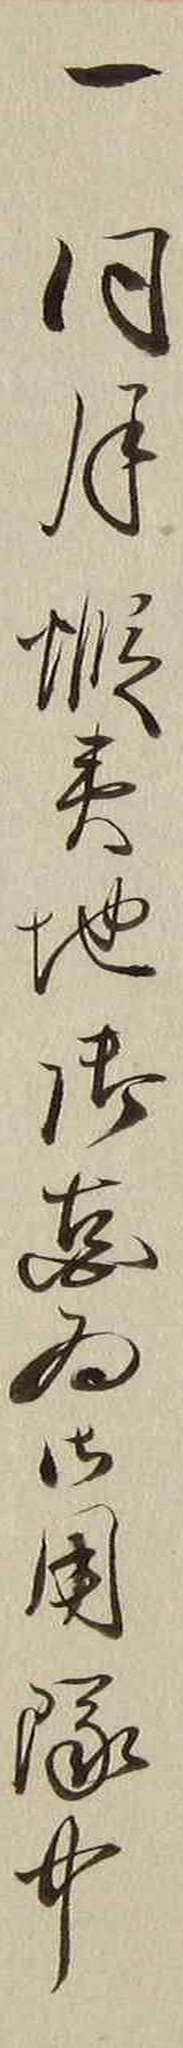一同月蝦夷地御固為御用隊中
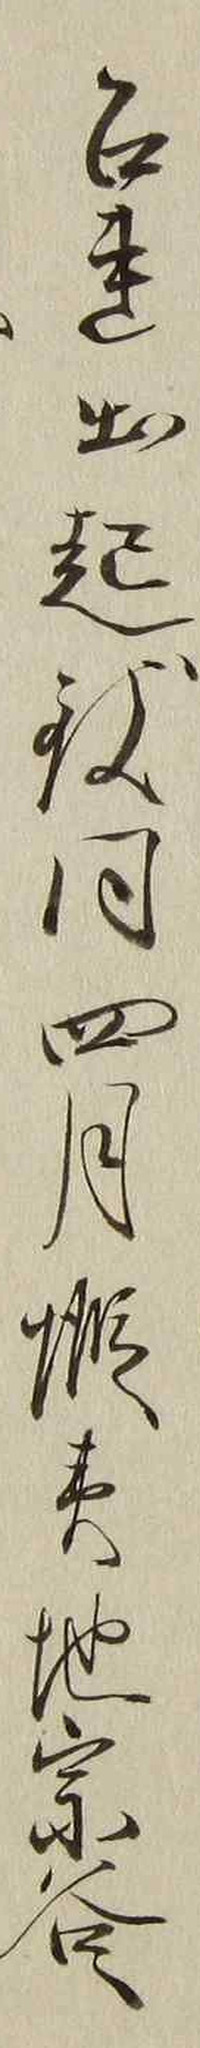召連出起致同四月蝦夷地宗谷へ
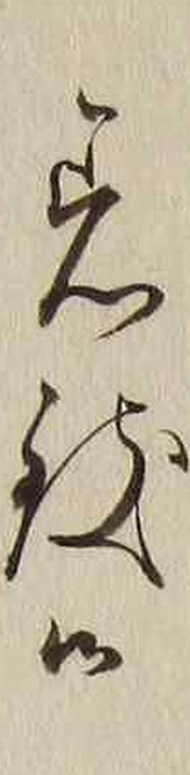着致侯
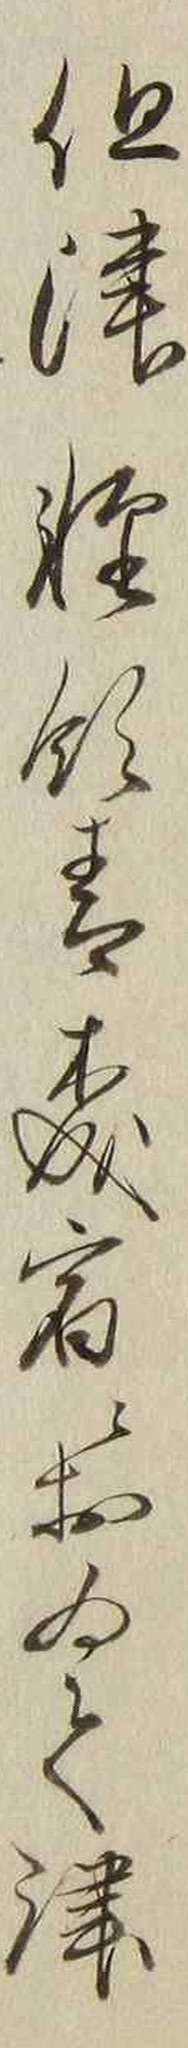但津軽領青森宿におゐて津
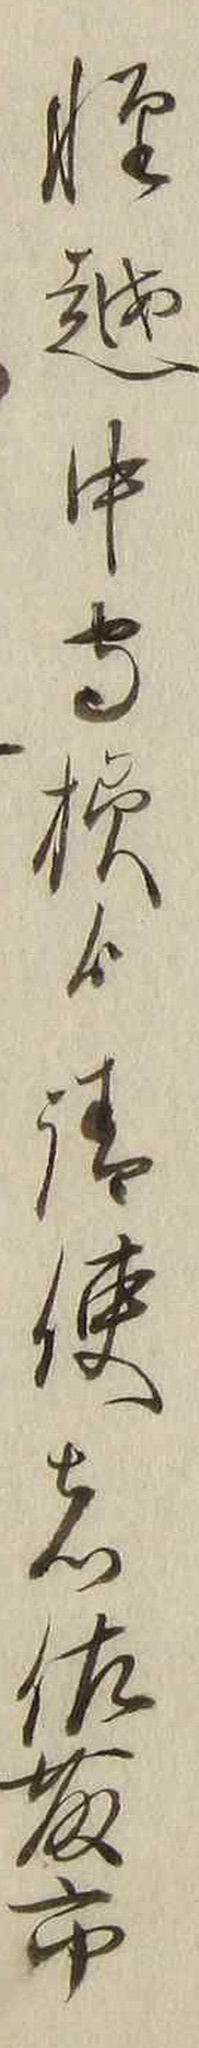軽越中守様ゟ御使者佐藤市
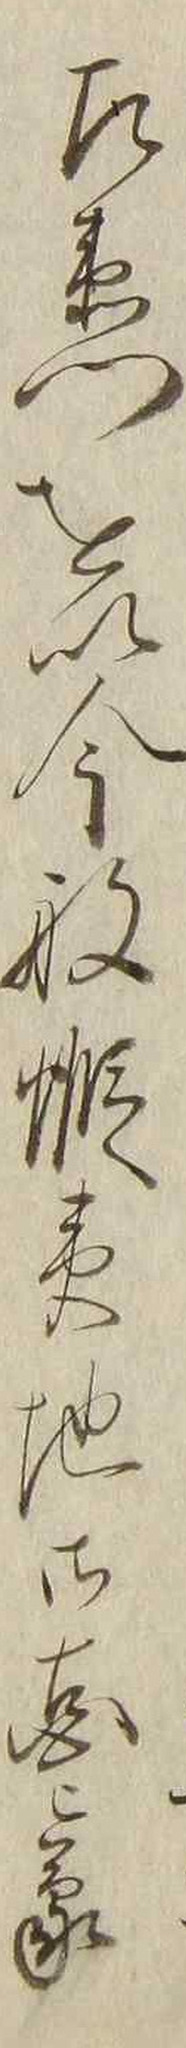左衛門を以今般蝦夷地御固被蒙
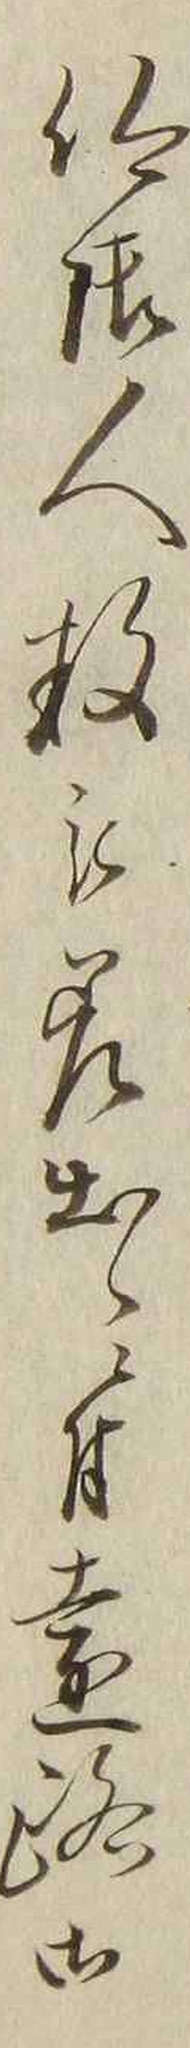仰御人数被差出候に付遠路御

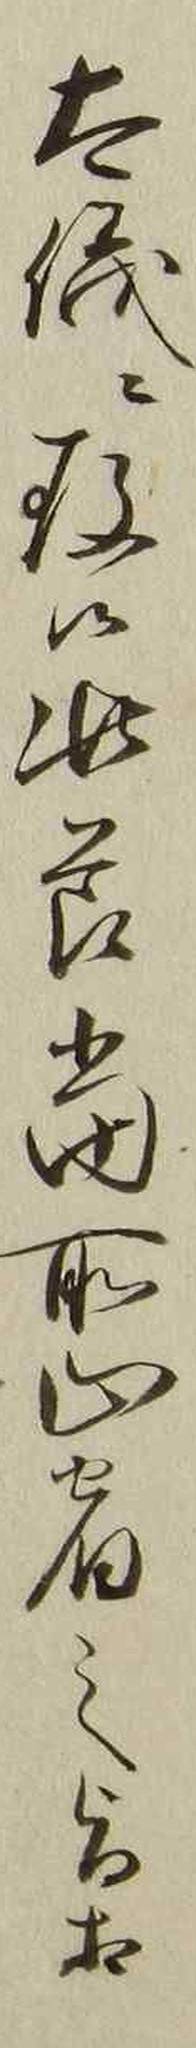太儀に存候此節当所止宿之旨相
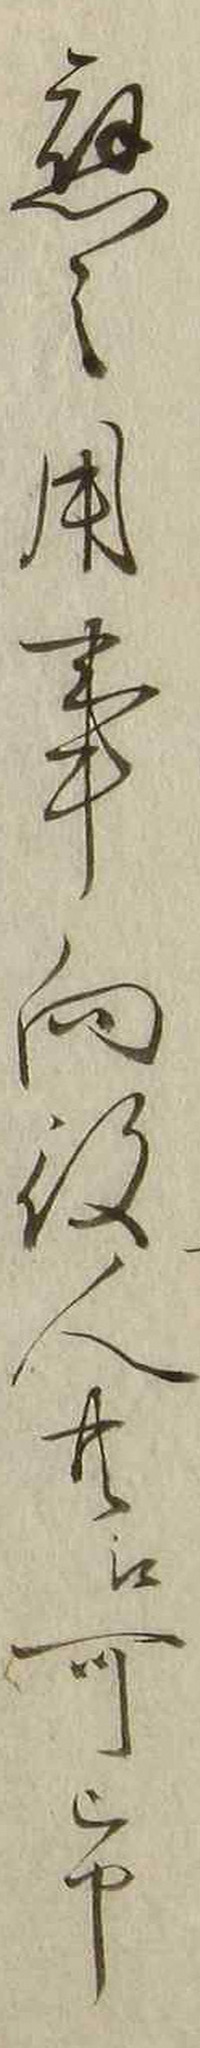応之用事向役人共江可被申
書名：諸士系譜　巻之103　か之部11
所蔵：会津若松市立会津図書館
